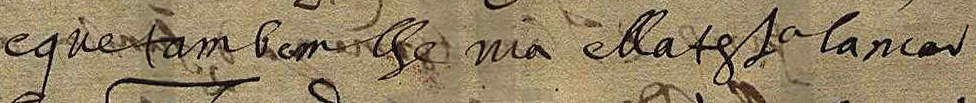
e que tambem lhe uia ella testa lançar
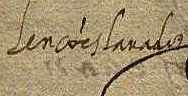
lencçes lauados
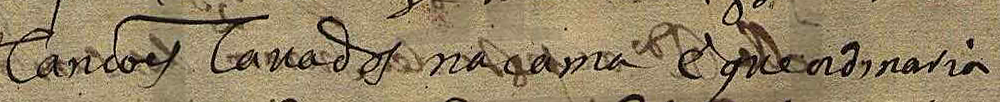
lançoes lauados na cama, e que ordinaria
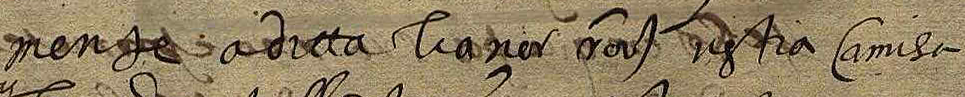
mente a ditta lianor roiz̄ uestia Camisa
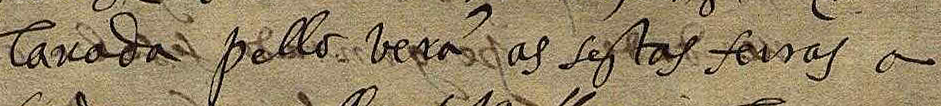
lauada pello verā as sestas feiras a
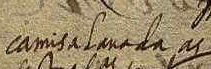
camisa lauada as
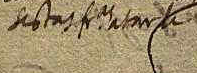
sestas fr.as a tarde
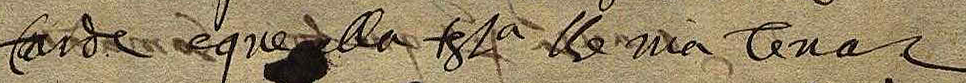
tarde e que ella testa lhe uia leuar
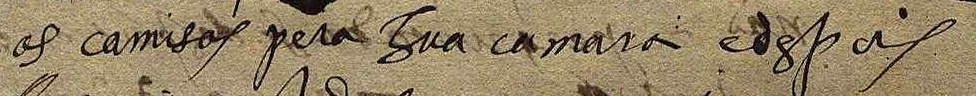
as camisas pera hua camara e despois
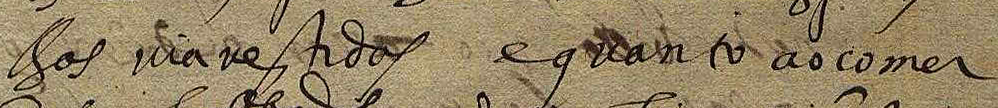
lhas uia uestidas e quanto ao comer
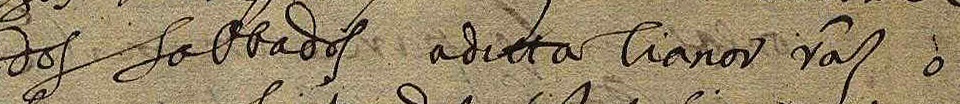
dos sabbados a ditta lianor rōiz o
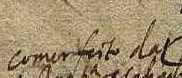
comer feito das
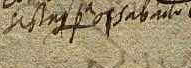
sestas ꝑa os sabado
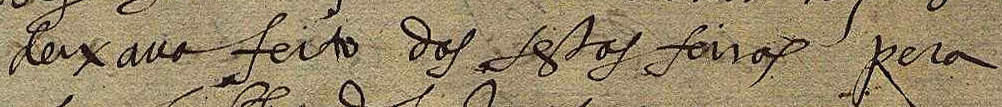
deixaua feito das sestas feiras pera
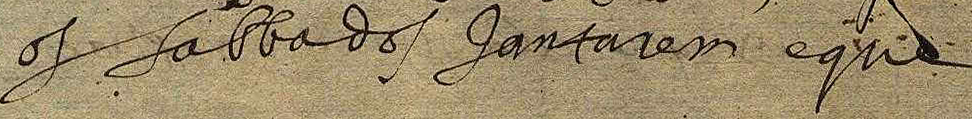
os sabbados Jantarem e que
